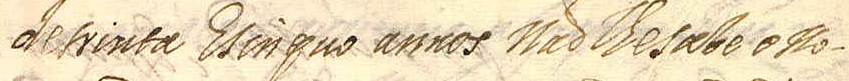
de trinta E sinquo annos naõ lhe sabe o no
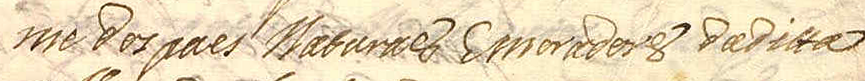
me dos paes naturaes E moradores da ditta
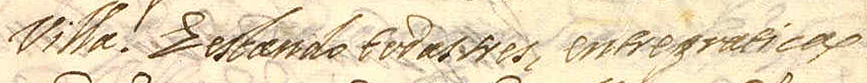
Villa. E estando todas tres, entre praticas
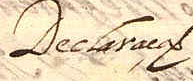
Declaraçaõ
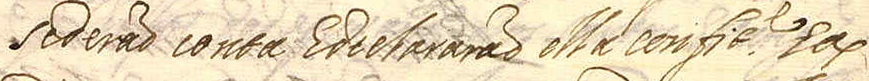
se derão conta E declararaõ ella confit.e E as
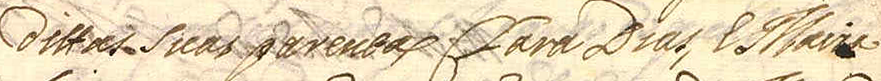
dittas suas parentas Clara Dias, E Maria
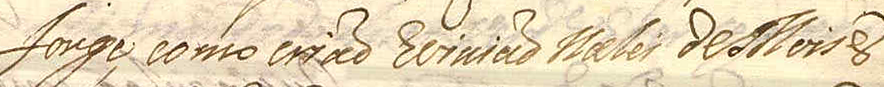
Jorge, como criaõ E uiuiaõ na lei de Moises
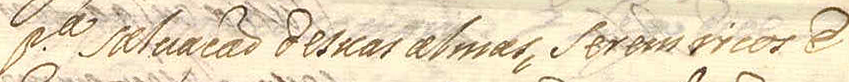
p.a saluação de suas almas, serem ricos E
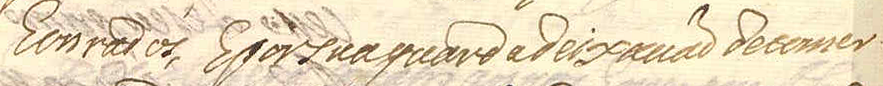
honrados, E por sua guarda deixauaõ de comer
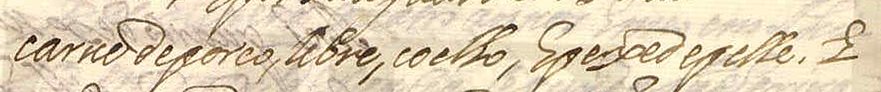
carne de porco, lebre, coelho, E peixe de pelle. E
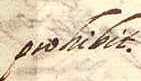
prohibit.
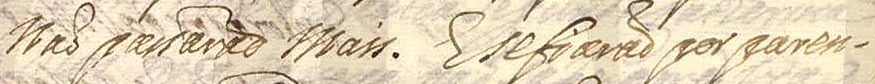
Naõ passarão mais. E se fiaraõ por paren
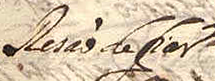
Resaõ de fiar
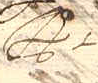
Tt 1
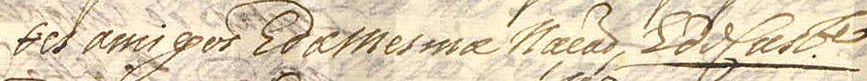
tes amigos E da mesma Naçaõ, e do Cust.e
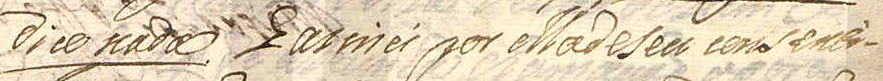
dice nada. E asinei por ella de seu consenti
